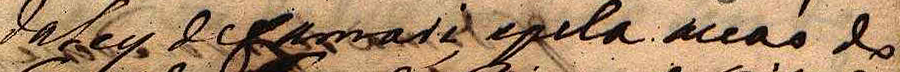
da Ley defamari, e pela acçaõ do
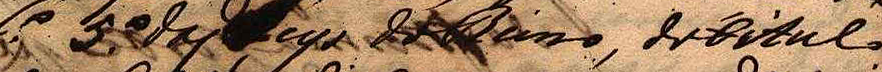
L.o 5o das Leys do Reino, do titulo
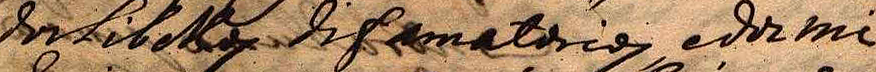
dos Libellos difamatorios, e doz mi
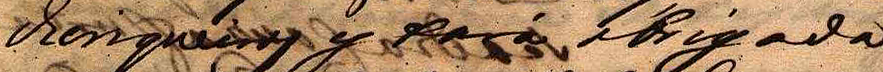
cheriqueiros estará obrigada
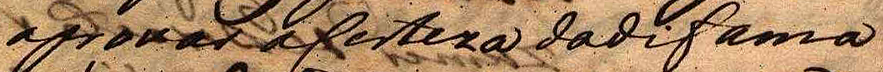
a provar a Certeza da difama
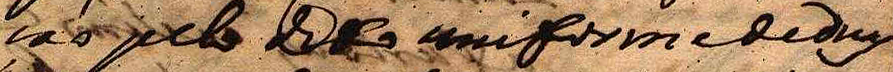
çaõ pelo dito uniforme de duas
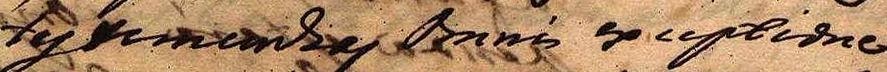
testemunhas Omnis exceptione
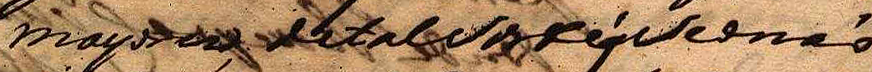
mayorez, de tal sorte q̄ se o naõ
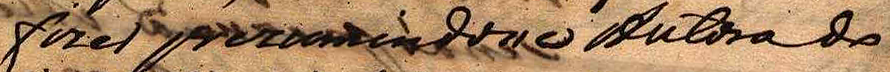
fizer prezumindosse Autora do
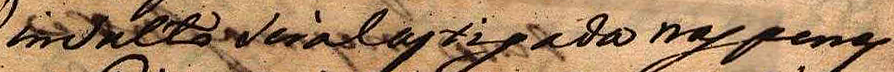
imsulto seria Castigada nas penas
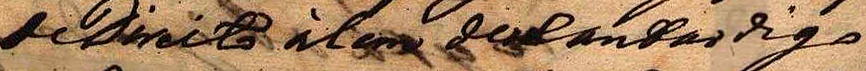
de Direito àlem de Cantar digo
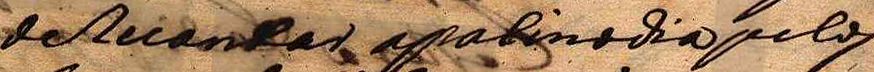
de Recantar a paci no dia pelos
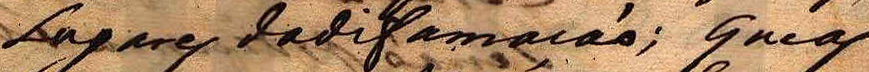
Lugares da difamaçaõ; Que as
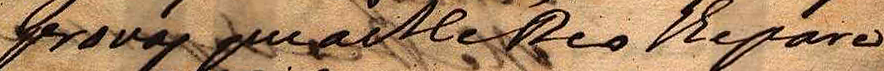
provas que a elle Reo lhe pare
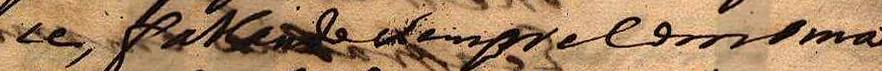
ce, fallando sempre com o ma
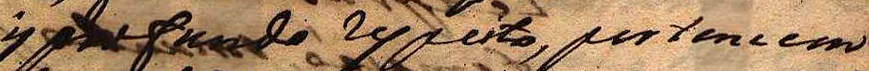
is profundo respeito, pertencem
